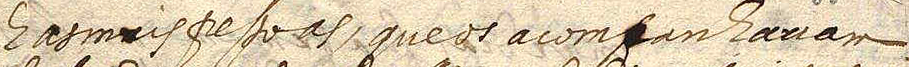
E as mais pessoas, que os acompanhauam
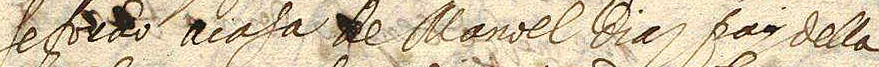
se forão a casa de Manoel dias pay della
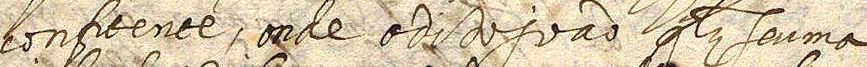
confitente, onde o dito joão gl̄z seu ma
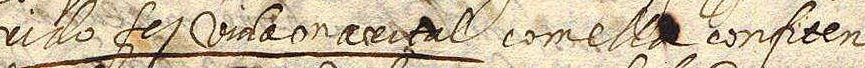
rido fez vida marital com ella confiten
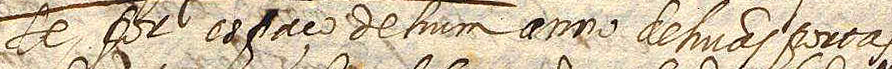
te, por espaço de hum anno de huās portas
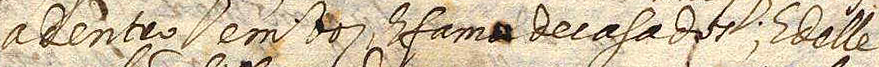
adentro em vos, E fama de casados; E delle
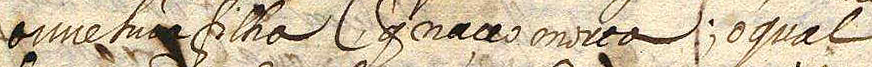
ouue huā filha, q̄ naçeo morta; o qual
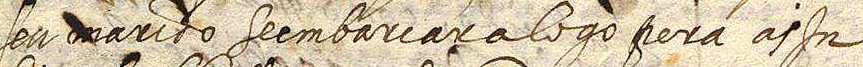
seu marido se embarcara logo pera as Jn
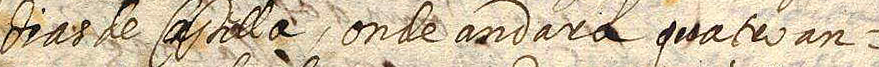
dias de Castella, onde andara quatro an
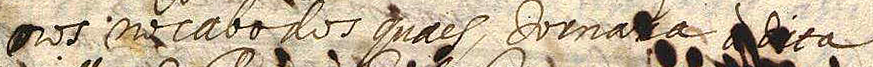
nos no cabo dos quaes, tornara a dita
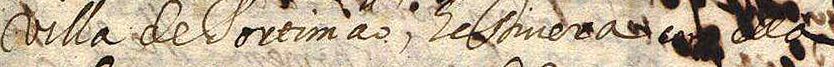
villa de Portimaõ, E estiuera co_ ella
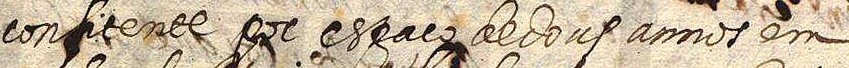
confitente por espaço de dous annos em
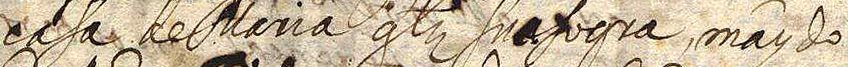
casa de Maria gl̄z sua sogra, may do
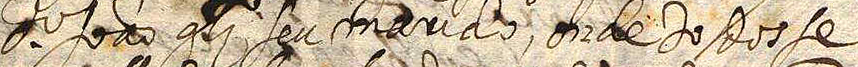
d.o João gl̄z seu marido, onde todos se
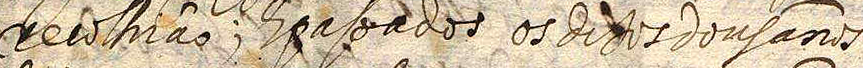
recolhião; E passados os ditos dous an̄os
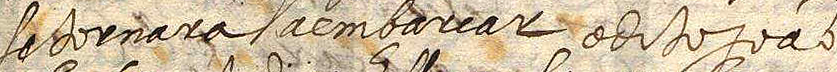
se tornara a embarcar o dito joão
